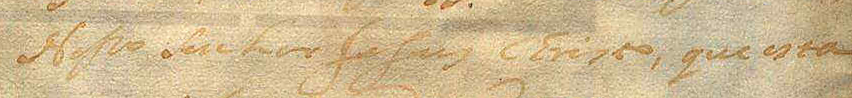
Nosso Senhor Jesus christo, que esta
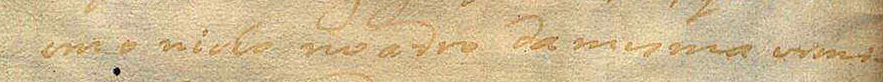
em o nicho no adro da mesma ermi
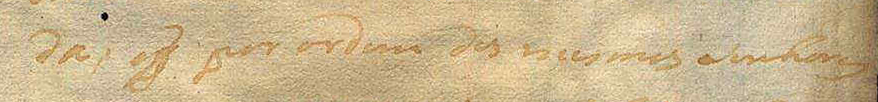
da, e q̄ por ordem dos mesmos senhores
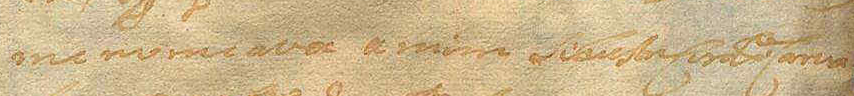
me nomeava a mim Silvestre Cord̄.o Carua
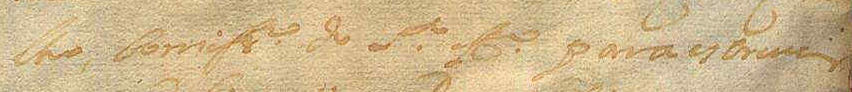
lho, Comisr.o do s.to off.o para escreuer
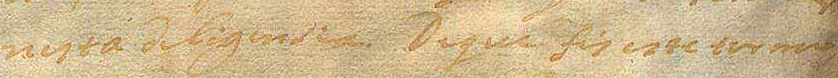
nesta diligensia. De que fis este termo
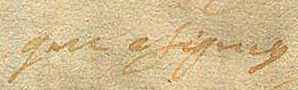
que asigney
